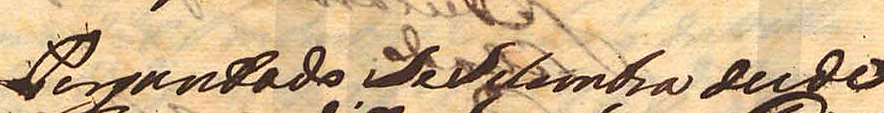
Perguntado Se Se lembra de de
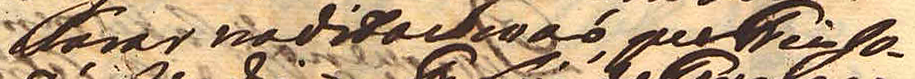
clarar na dita Sessaõ, que Frei Jo
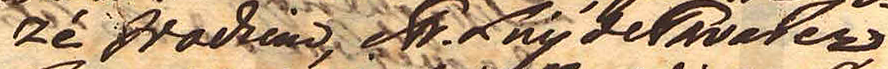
zé Joachim, e Fr. Luis de Tavares
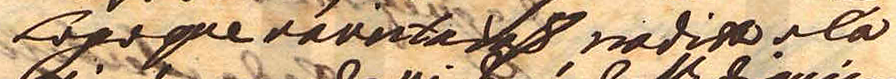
Logo que o avistavaõ na dita oca
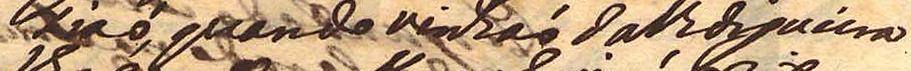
ziaõ, quando vinhaõ da Vidigueira
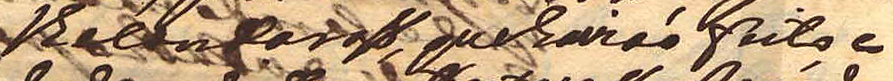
lhe contaraõ, que haviaõ feito, e
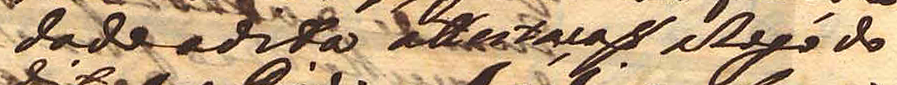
dado a dita attestaçaõ a Rogo do
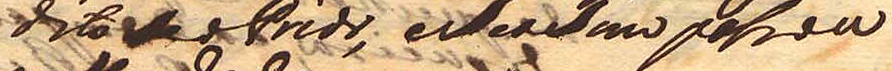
dito seo Prior, e Se asim passou
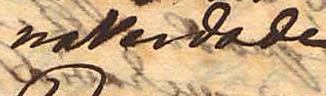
na verdade
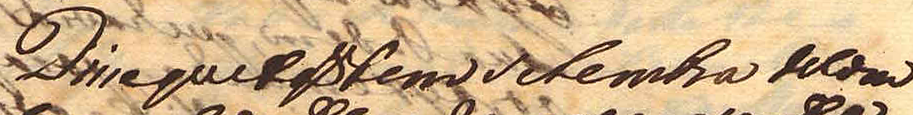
Disse que taõbem se lembra se com
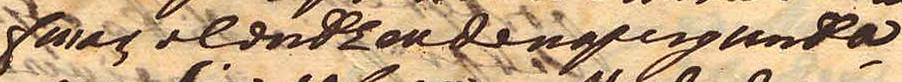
fessar, o contheudo na pergunta
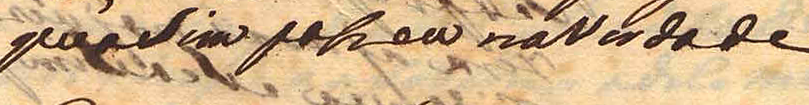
que asim passou na Verdade
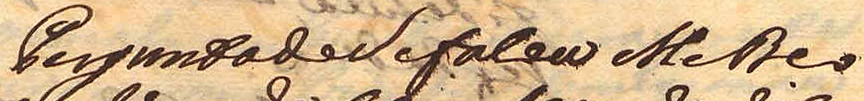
Perguntado Se falou elle Reo
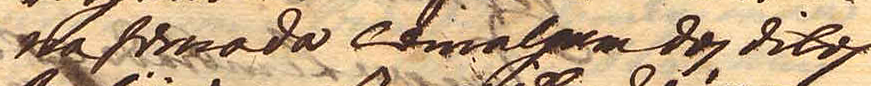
na Jornada com algum dos ditos
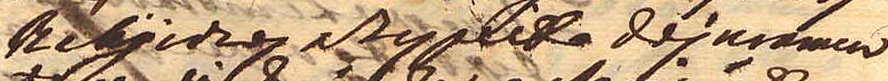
Religiozos a Respeito do juramen
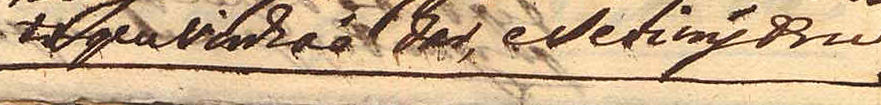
to que vinhaõ dar, e se os instru
